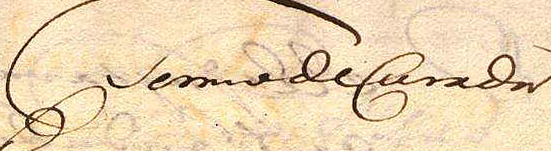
Termo de Curador
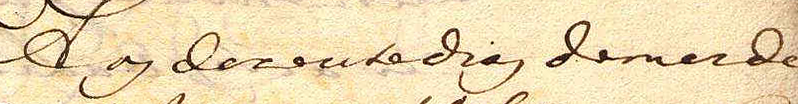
Aos dezouto dias do mez de
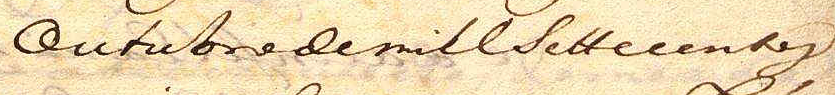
Outubro de mil e Settecentos
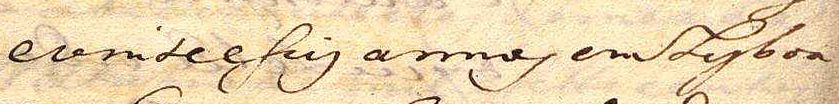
e vinte e seis annos em Lisboa
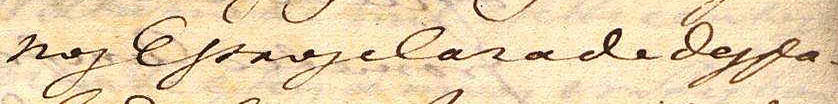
nos Estaos e Caza de despa
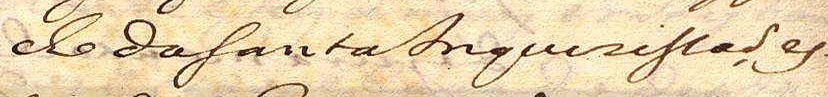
cho da santa Inquizissaõ, es
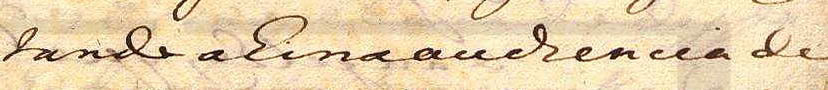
tando ahi na audiencia de
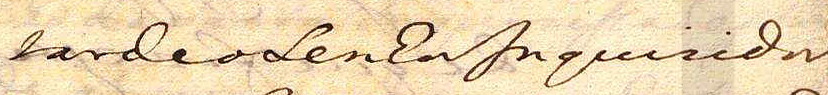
tarde o senhor Jnquizidor
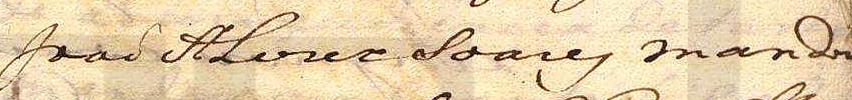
Joaõ ALvrez Soares mandou
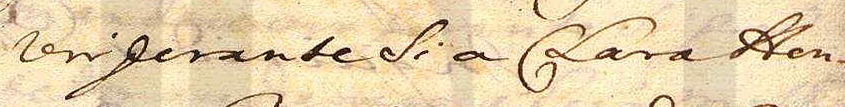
vir perante Si a CLara Hen
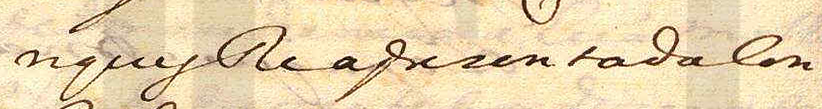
riques Re aprezentada Con
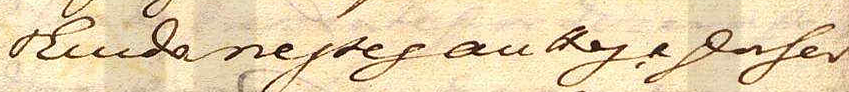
theuda nestes auttos, e por ser
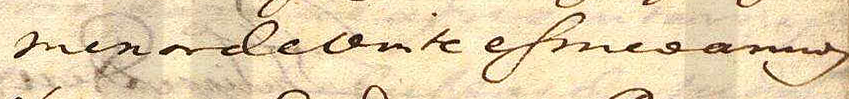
menor de vinte e sinco annos
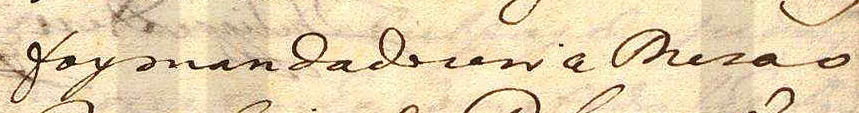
foy mandado vir a Meza o
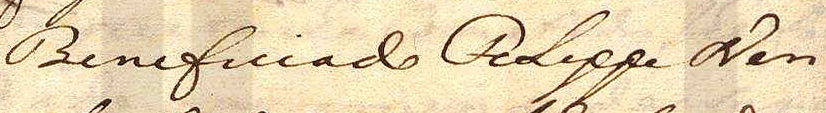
Beneficiado FeLippe Neri
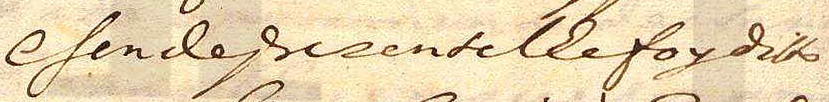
e sendo prezente lhe foy ditto
